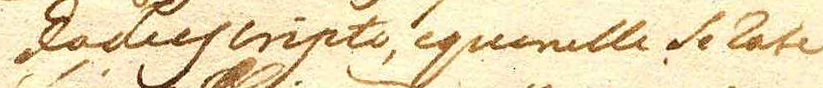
dade escripto, e que nelle se Rate
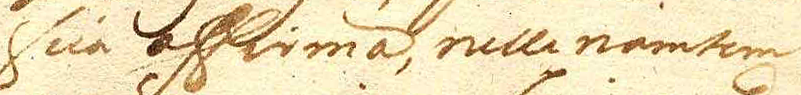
fica affirma, nelle nam tem
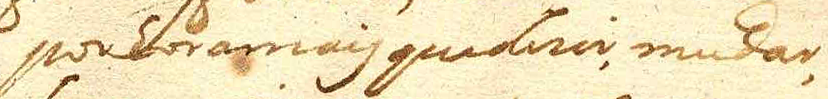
por hora mais que dizer, mudar,
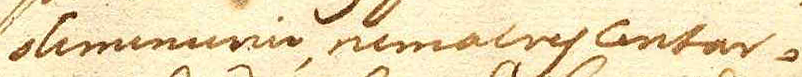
demenuir, nem acrescentar o
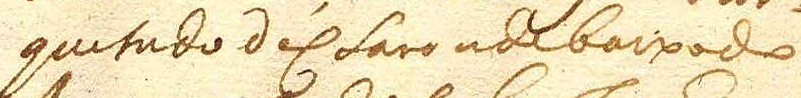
que tudo deClarou debaixo do
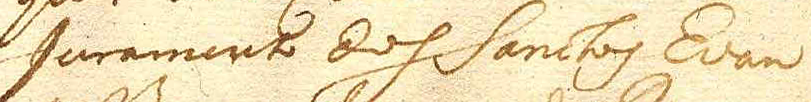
Juramento dos Sanctos Evan
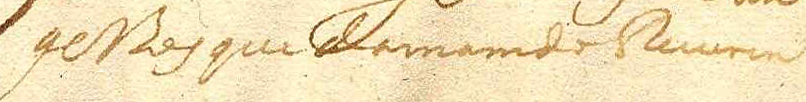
gelhos que da mam do Reueren
